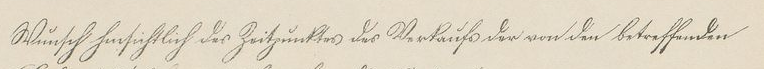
Wunsch hinsichtlich des Zeitpunktes des Verkaufs der von den betreffenden
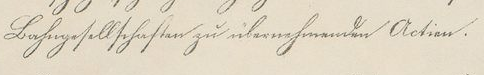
Bahngesellschaften zu übernehmenden Actien.
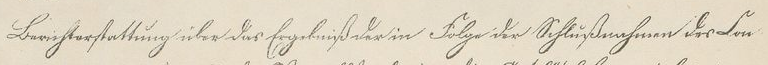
Berichterstattung über das Ergebniß der in Folge der Schlußnahmen des Con-
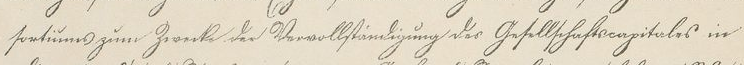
sortiums zum Zwecke der Vervollständigung des Gesellschaftscapitales in
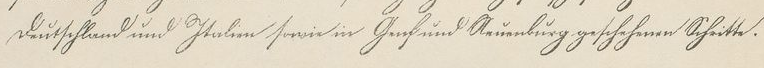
Deutschland und Italien sowie in Genf und Neuenburg geschehenen Schritte.
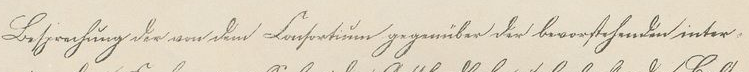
Besprechung der von dem Consortium gegenüber der bevorstehenden inter-
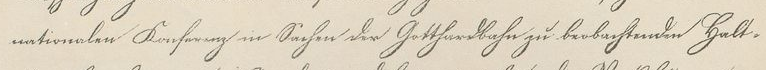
nationalen Konferenz in Sachen der Gotthardbahn zu beobachtenden Halt-
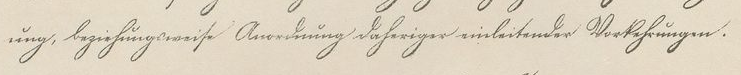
ung, beziehungsweise Anordnung daheriger einleitender Vorkehrungen.
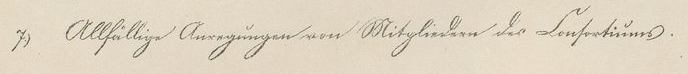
7.) Allfällige Anregungen von Mitgliedern des Consortiums.
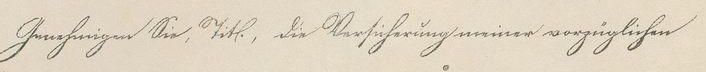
Genehmigen Sie, Tit., die Versicherung meiner vorzüglichen
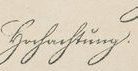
Hochachtung.
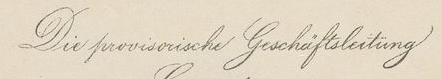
Die provisorische Geschäftsleitung
